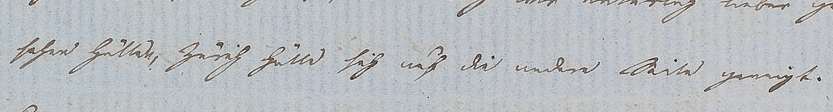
sehen hätten, Zürich hätte sich auf die andere Seite geneigt.
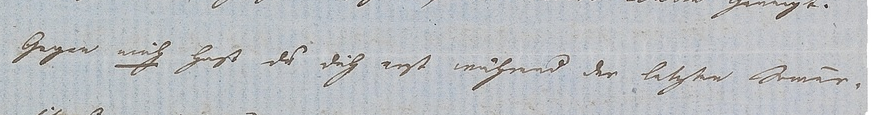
Gegen mich hast Du Dich erst während der letzten Sommer-
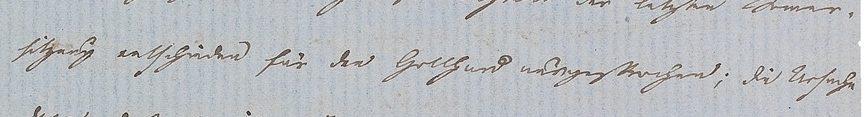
sitzung entschieden für den Gotthard ausgesprochen; die Ursache
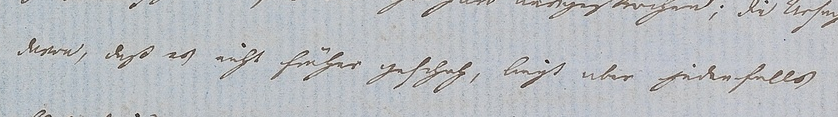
davon, daß es nicht früher geschah, liegt aber jedenfalls
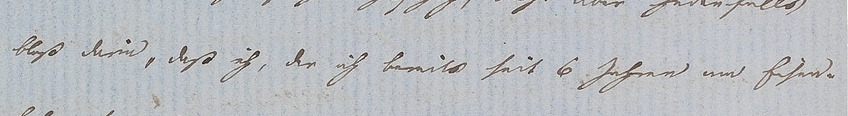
bloß darin, daß ich, der ich bereits seit 6 Jahren am Eisen-
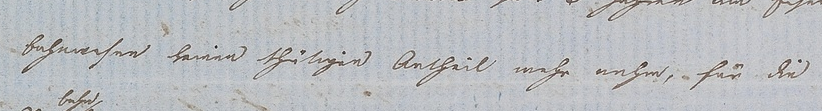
bahnwesen keinen thätigen Antheil mehr nahm, für die
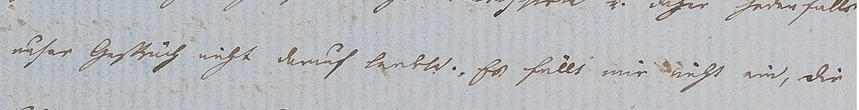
unser Gespräch nicht darauf lenkte. Es fällt mir nicht ein, Dir
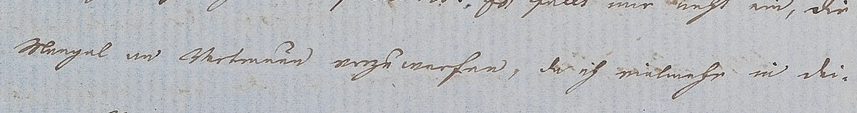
Mangel an Vertrauen vorzuwerfen, da ich vielmehr in Dei-
